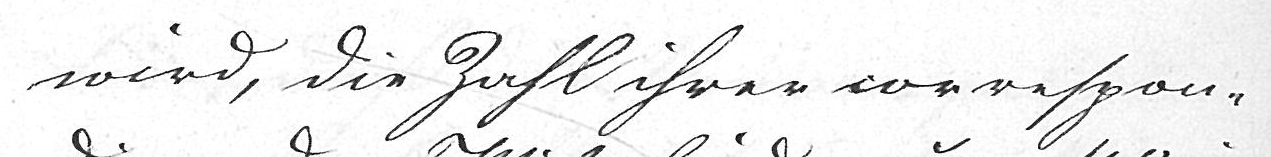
wird, die Zahl ihrer correspon-
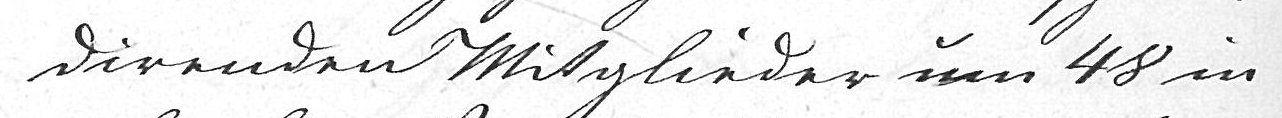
direnden Mitglieder um 48 in
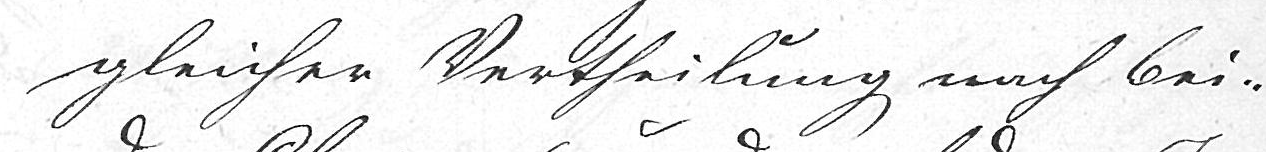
gleicher Vetheilung nach bei-
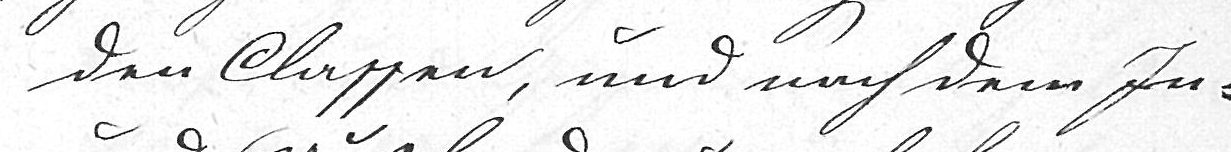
den Classen, und nach dem In-
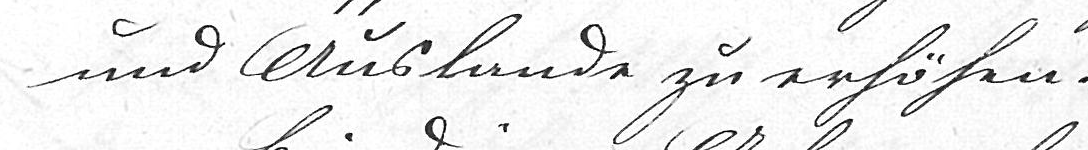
und Auslande zu erhöhen.
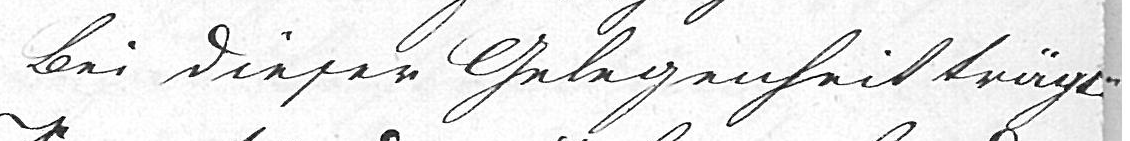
Bei dieser Gelegenheit trägt
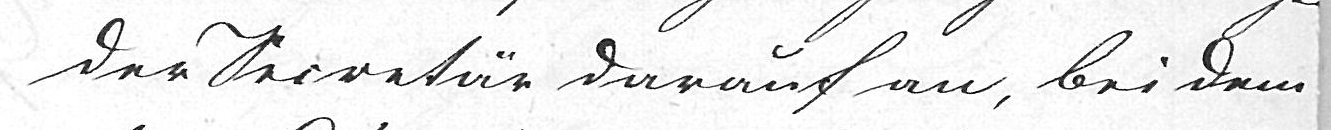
der Secretär darauf an, bei dem
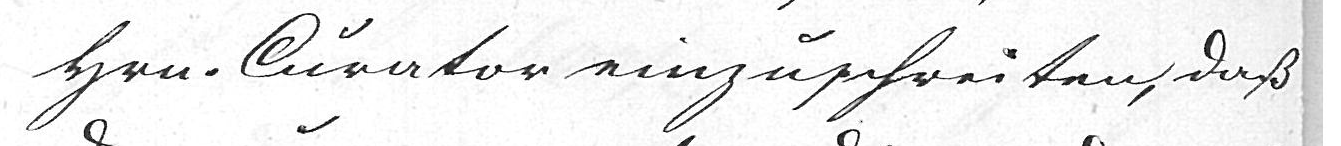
Hrn. Curator einzuschreiten, daß
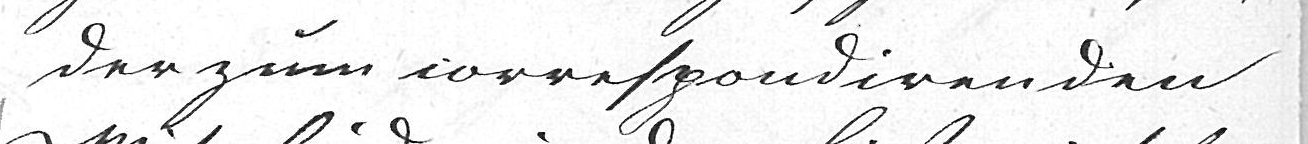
der zum correspondirenden
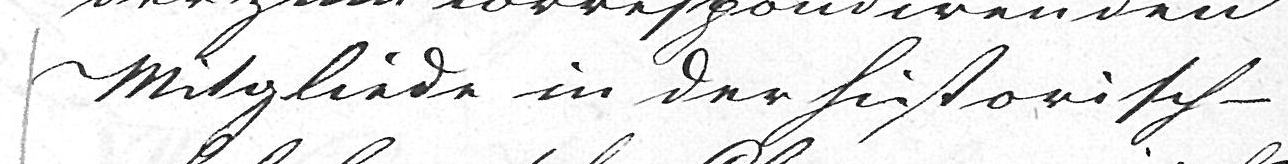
Mitgliede in der historische-
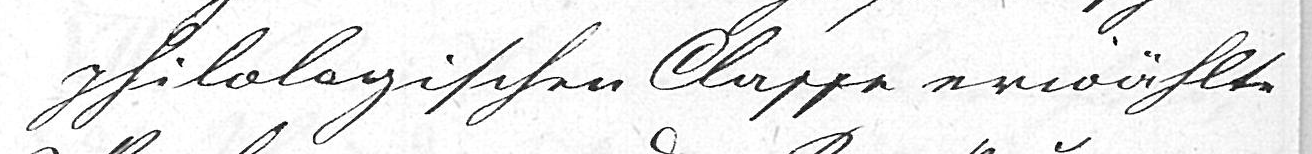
philologischen Classe erwählte
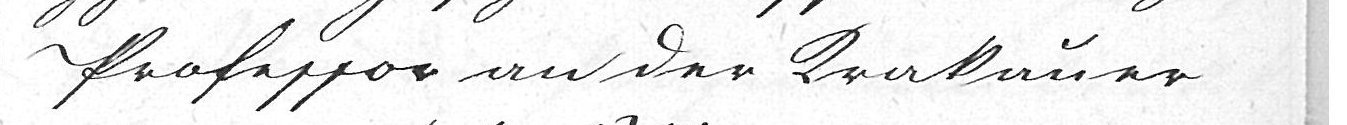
Professor an der Krakauer
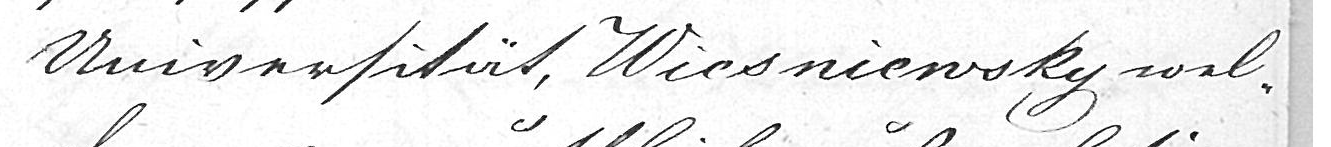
Universität, Wiesniewsky wel-
